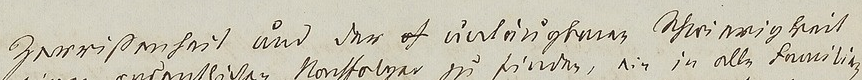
Zerrissenheit und der unläugbaren Schwierigkeit
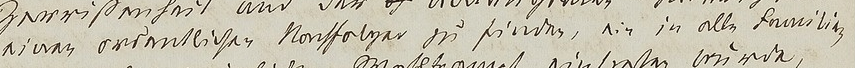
einen ordentlichen Nachfolger zu finden, ein in alle Familien
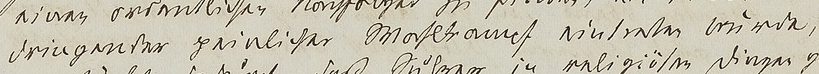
dringender peinlicher Wahlkampf eintreten würde,
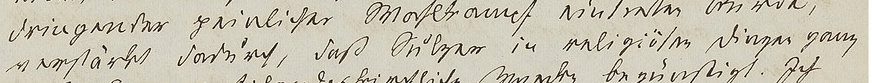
verstärkt dadurch, daß Sulzer in religiösen Dingen ganz
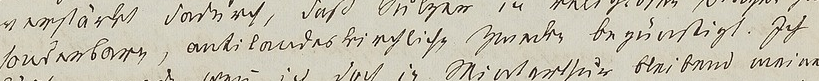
sonderbare, antilandeskirchliche Zwecke begünstigt. Ich
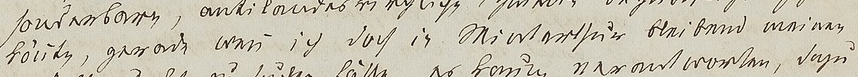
könnte, gerade wenn ich doch in Winterthur bleibend meinen
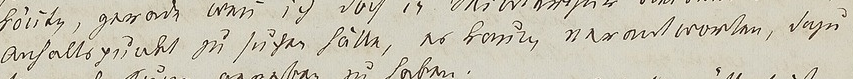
Anhaltspunkt zu suchen hätte, es kaum verantworten, dazu
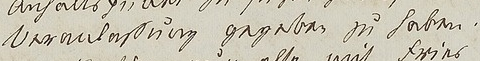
Veranlassung gegeben zu haben.
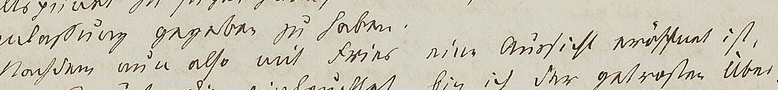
Nachdem nun also mit Fries eine Aussicht eröffnet ist,
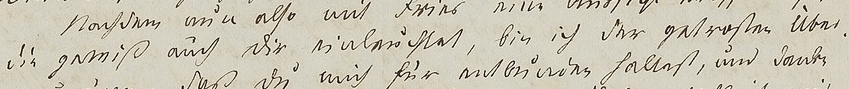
die gewiß auch Dir einleuchtet, bin ich der getrosten Über-
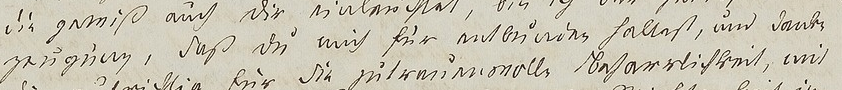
zeugung, daß Du mich für entbunden haltest, und danke
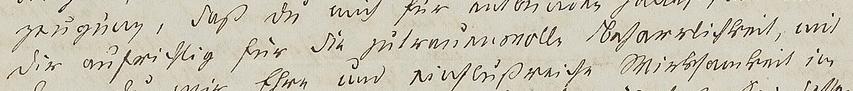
Dir aufrichtig für die zutrauensvolle Beharrlichkeit, mit
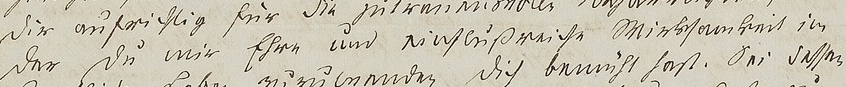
der Du mir Ehre und einflußreiche Wirksamkeit im
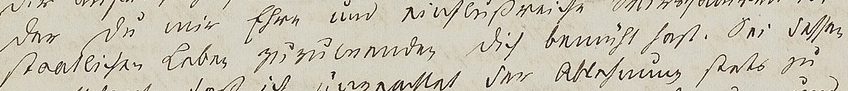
staatlichen Leben zuzuwenden Dich bemüht hast. Sei dessen
